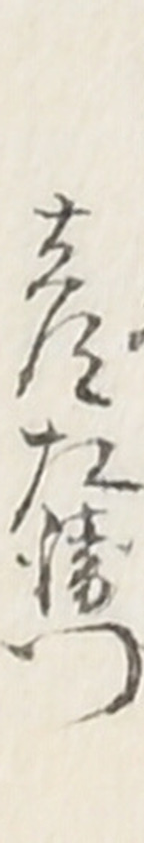彦左衛門
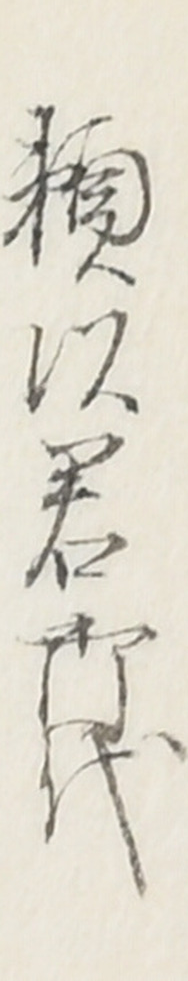頼以君御代
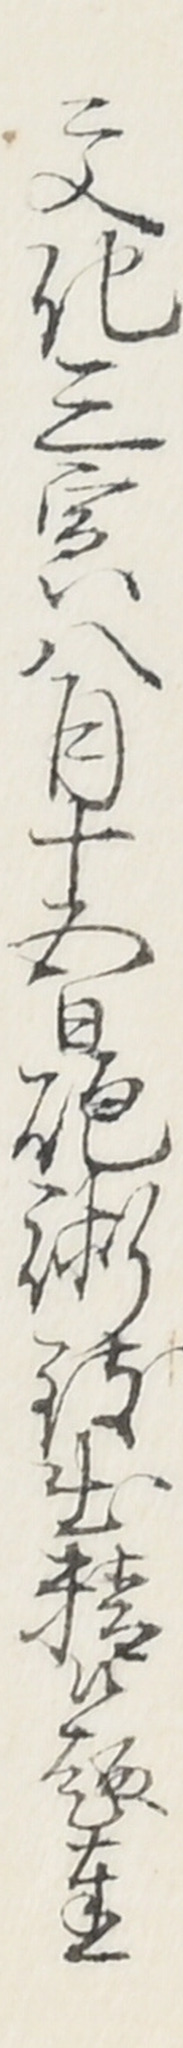一文化三寅八月十五日砲術致出精候趣達
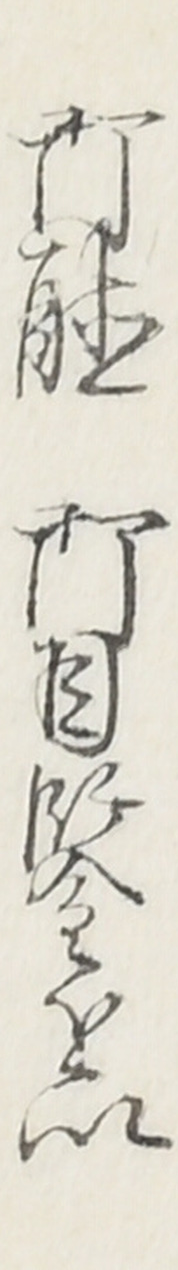御聴御目鑑を以
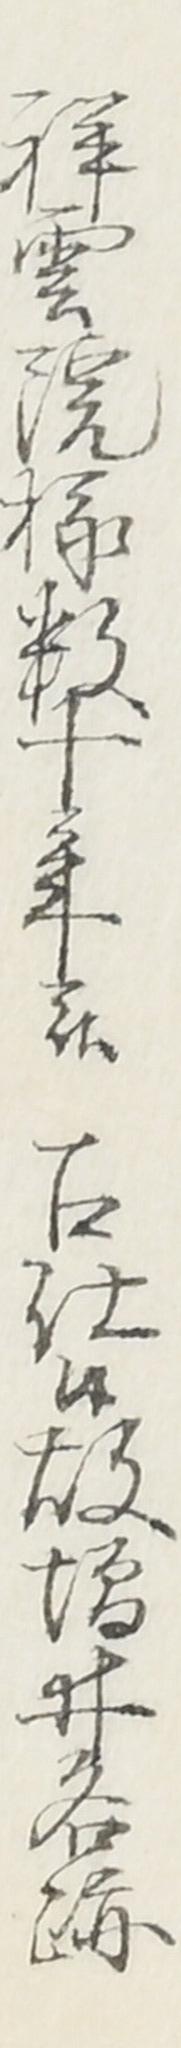祥雲院様数十年被召仕候故増井名跡
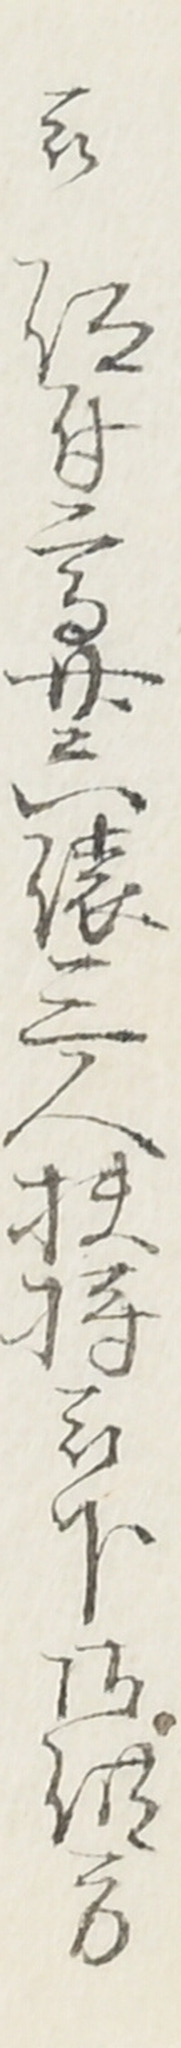被仰付高廿六俵三人扶持被下御供方
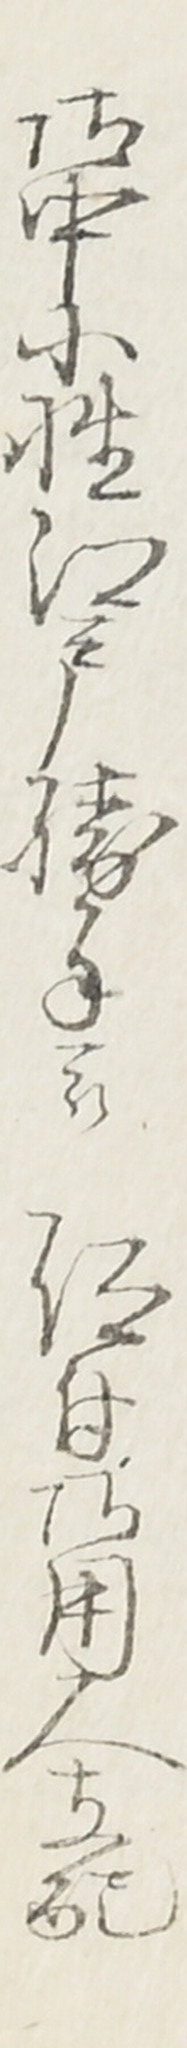御中小性江戸勝手被仰付御用人支配
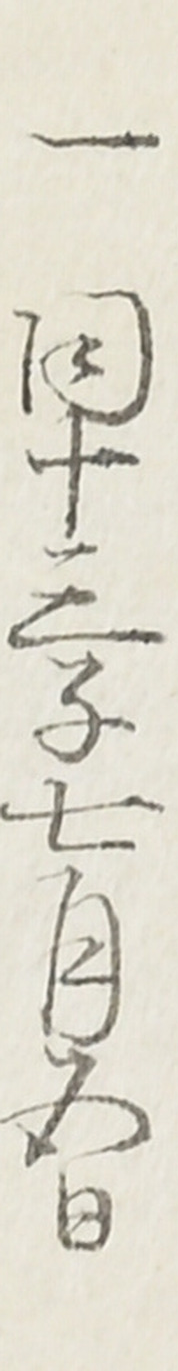一同十三子七月五日
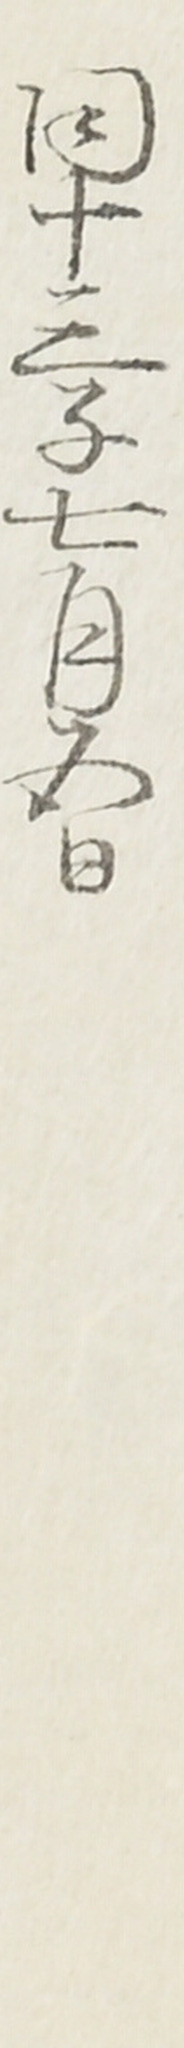一同十三子七月五日
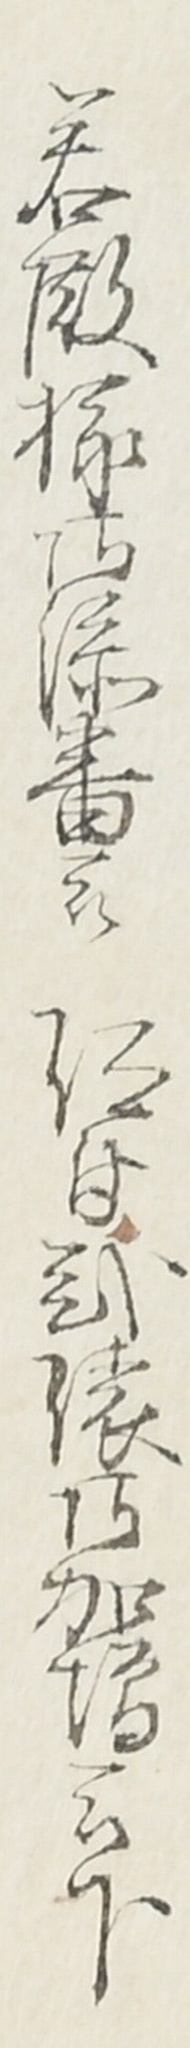若殿様御添番被仰付弐俵御加増被下
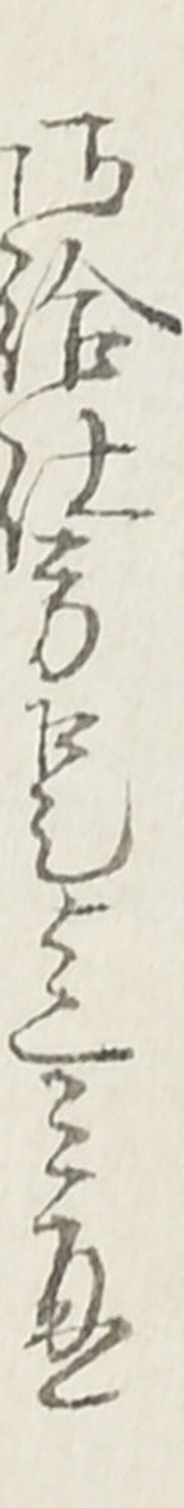御給仕方是迄之通
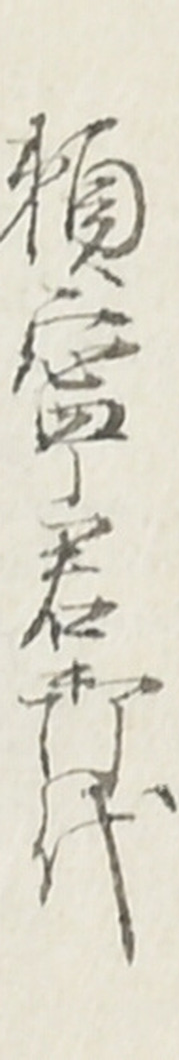頼寧君御代
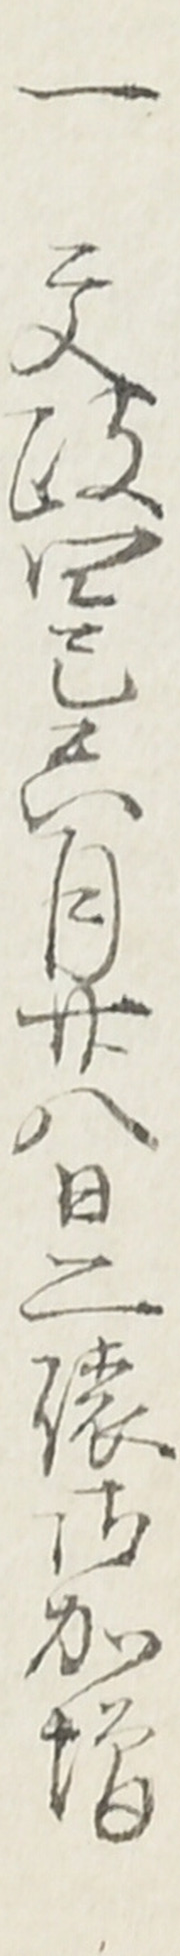一文政四巳六月廿八日二俵御加増
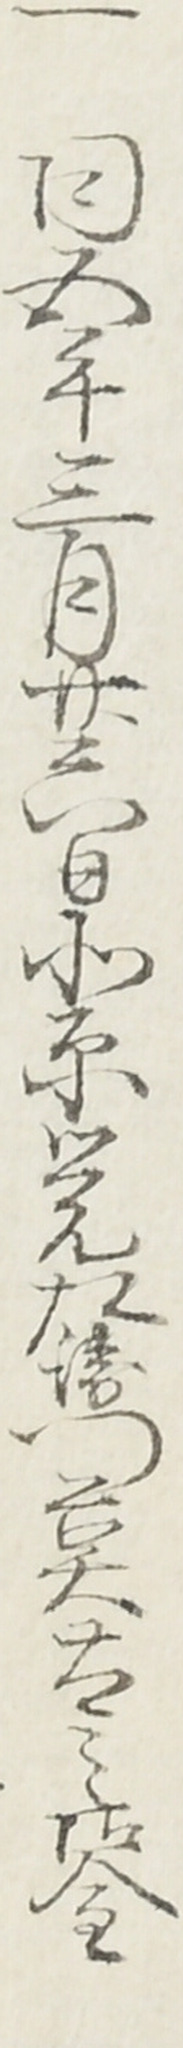一同五午三月廿六日北原覚左衛門莫太之御金
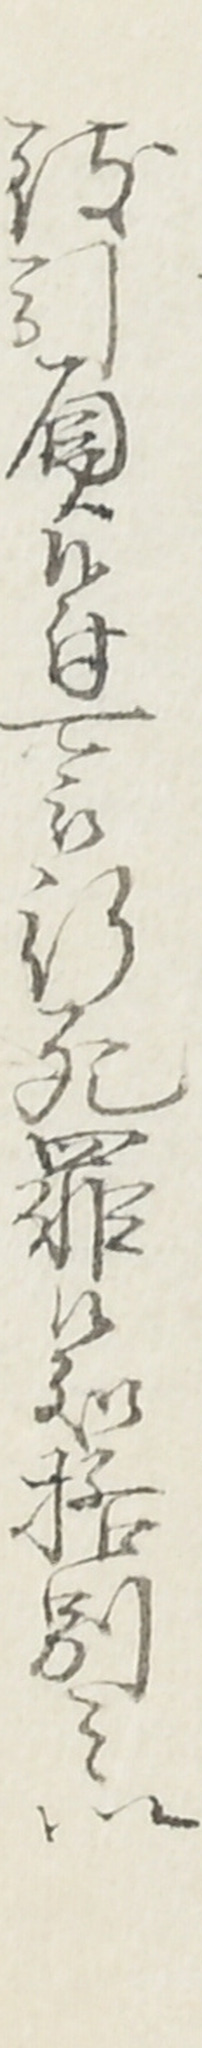致引負候付可被行死罪候処格別之以
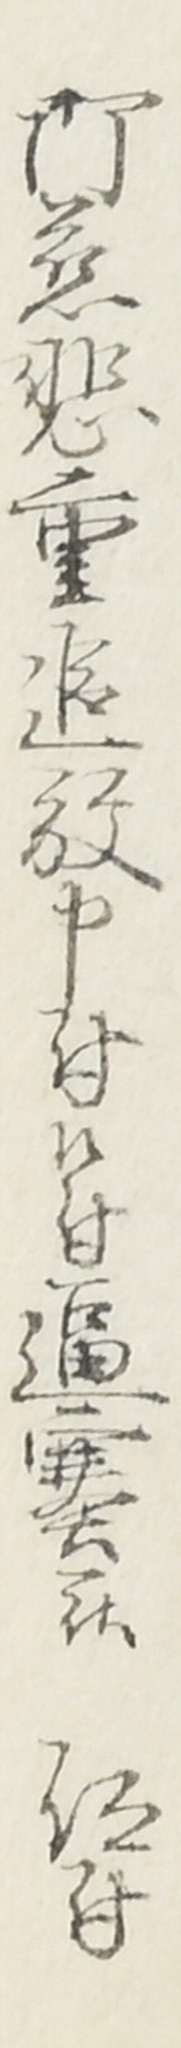御慈悲重追放申付候付逼塞被仰付
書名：無足諸士勤仕録（四）
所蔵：伊那市立高遠町図書館・合同会社AMANE
